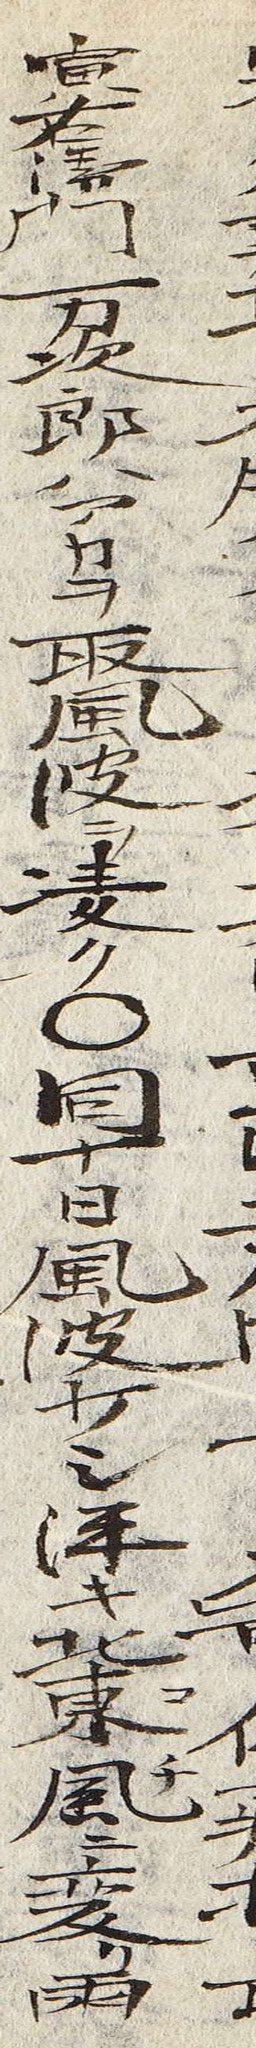寅右衛門万次郎ハアカヲ取風波ヲ凌ク〇同十日風波少シ泙キ北東風ニ変リ雨
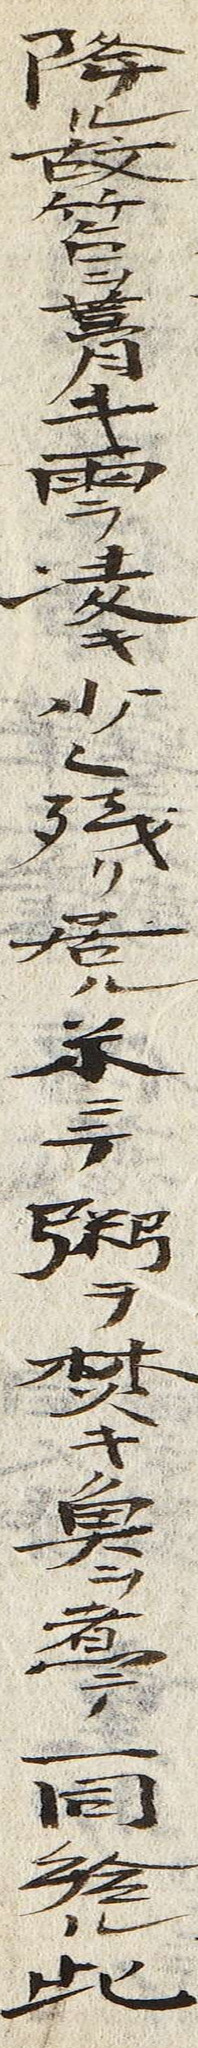降ル故苫ヲ葺キ雨ヲ凌キ少々残リ居ル米ニテ粥ヲ焚キ魚ヲ煮テ一同給ル此
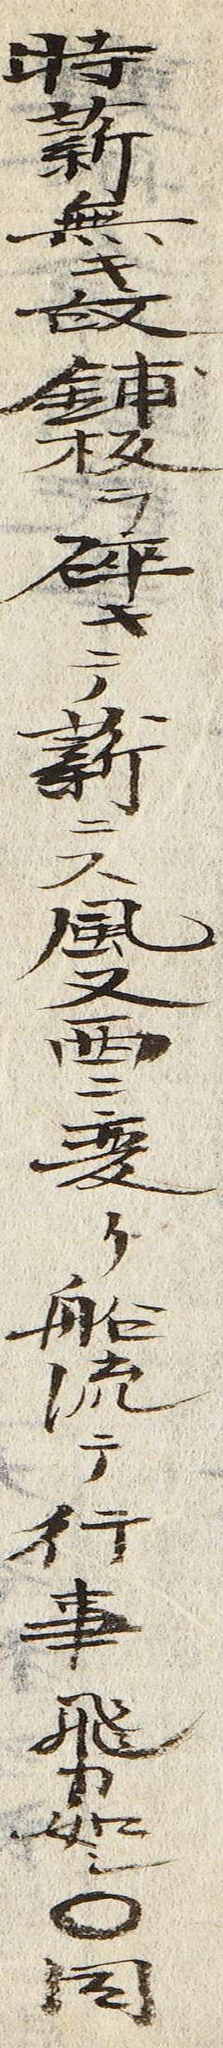時薪無キ故鋪板ヲ砕キテ薪ニス風又西ニ変リ船流テ行事飛カ如シ〇同
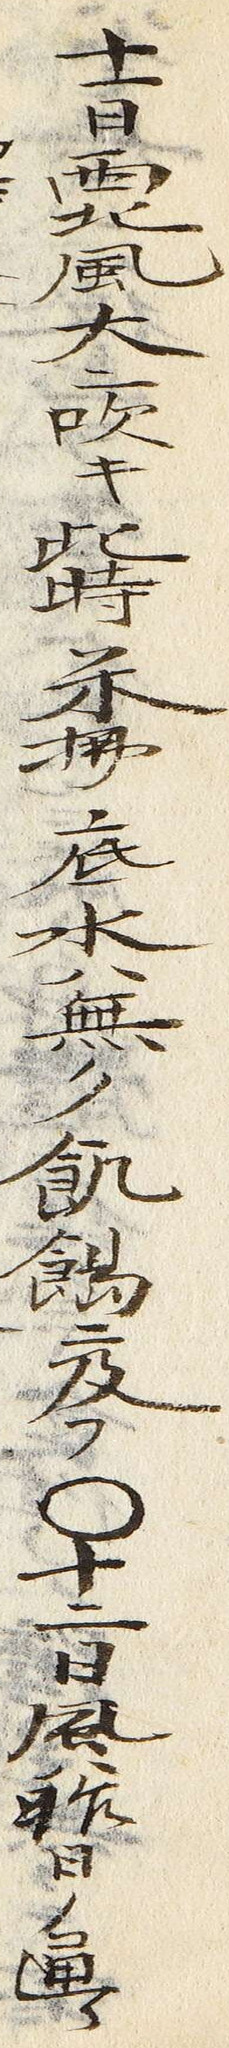十一日西北風大ニ吹キ此時米払底水ハ無ク飢餲ニ及フ〇十二日風ハ昨日ノ通リ
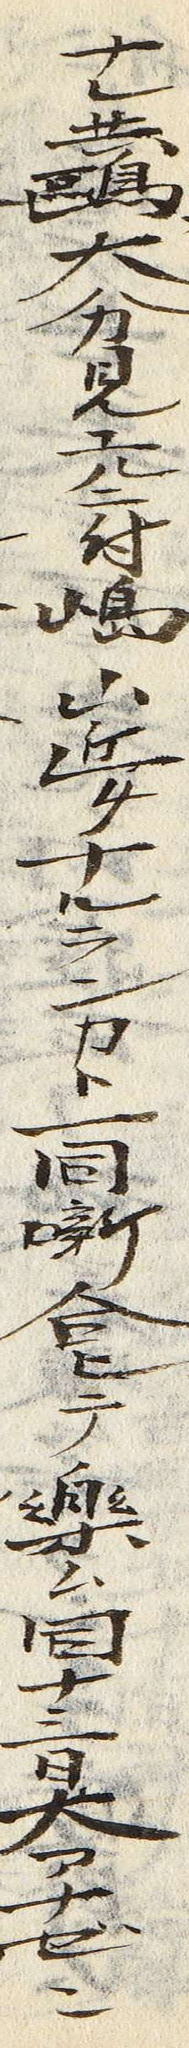ナレ共鷗大分見ユルニ付嶋山近クナルランカト一同噺合ヒテ楽ム同十三日大アナゼン
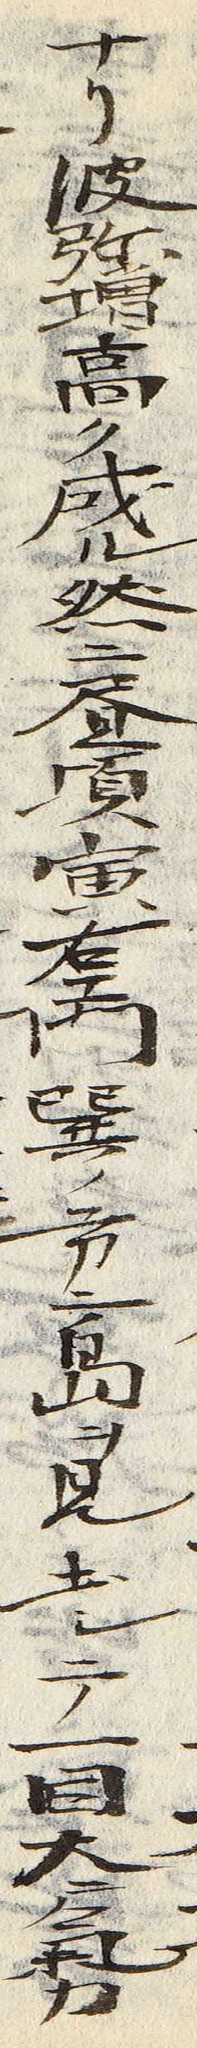ナリ波弥増高ク成ル然ニ昼頃寅右衛門巽ノ方ニ島ヲ見出シテ一同大ニ気力
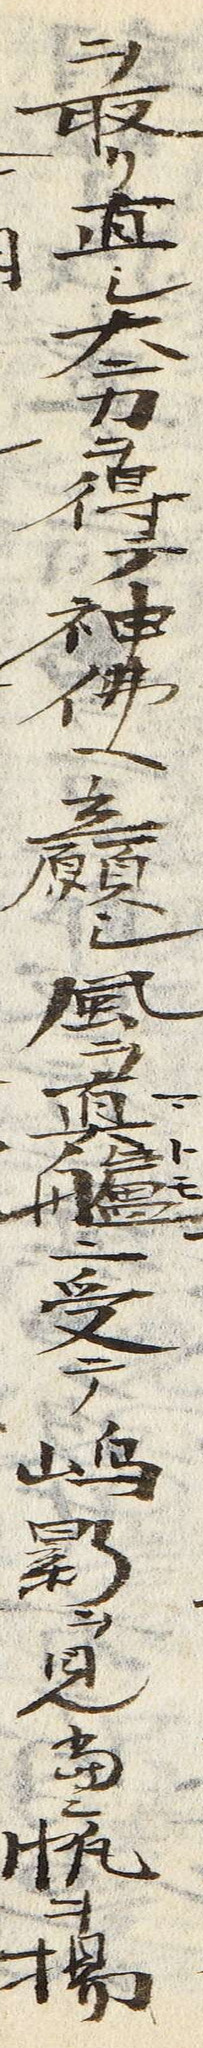ヲ取リ直シ大ニ力ヲ得テ神仏ヘ立願シ風ヲ真艫ニ受テ嶋影ヲ見当ニ帆ヲ揚
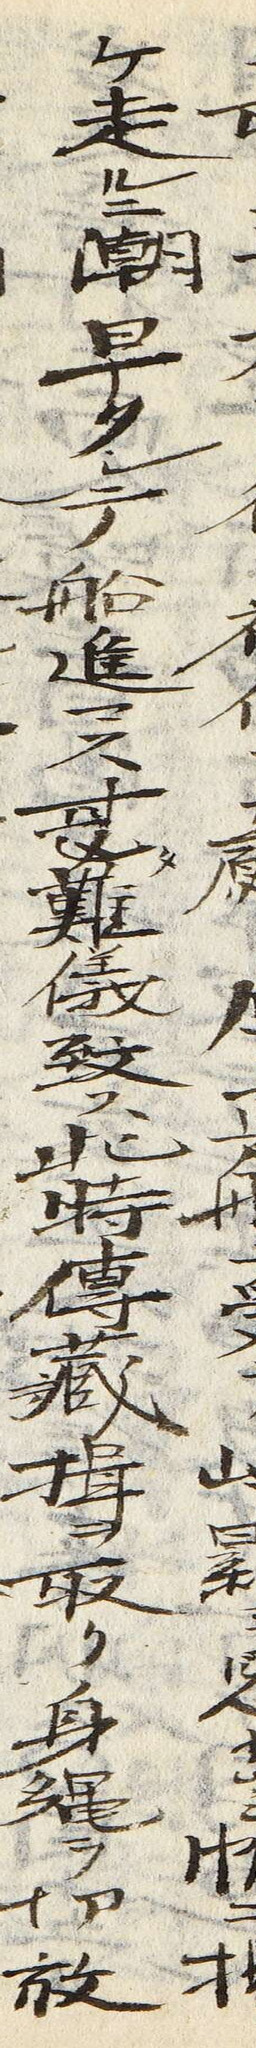ケ走ルニ潮早クシテ船進マス甚難儀致ス此時傳蔵楫ヲ取リ身縄ヲ切放
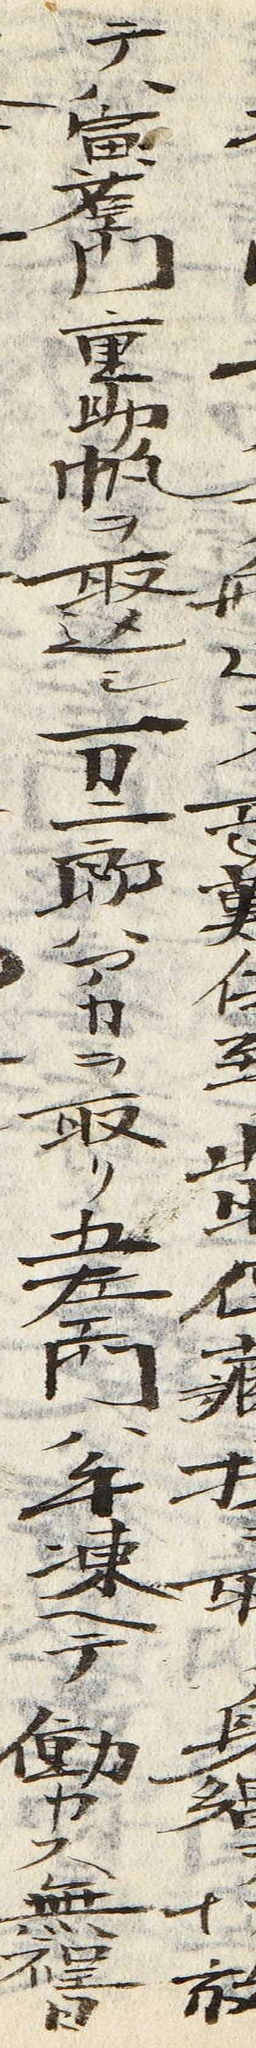テハ寅右衛門重助帆ヲ取込シ万次郎ハアカヲ取リ五左衛門ハ手凍ヘテ働カス無程日
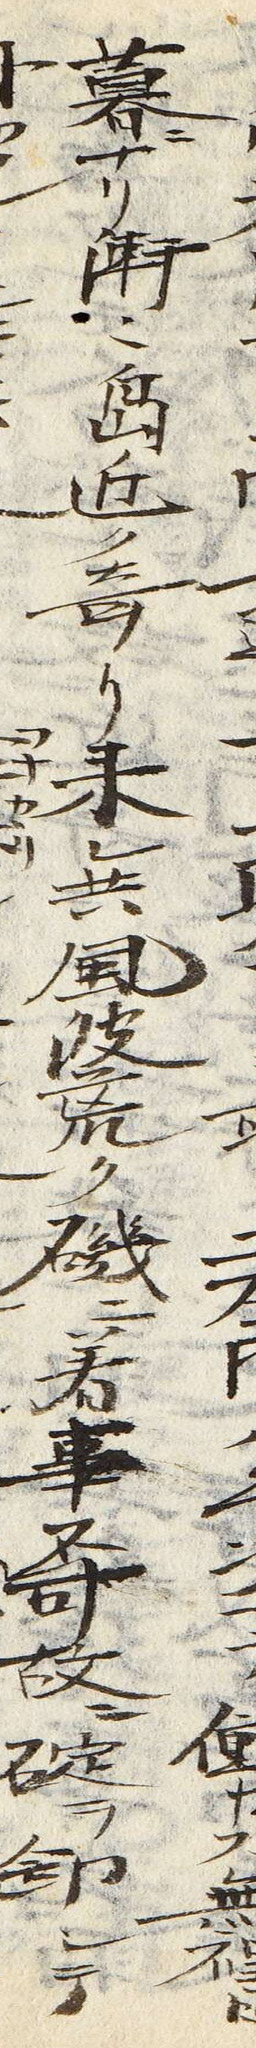暮ナリ漸く島近ク寄リ来レ共風波荒ク磯ニ着事不可故ニ碇ヲ卸シテ
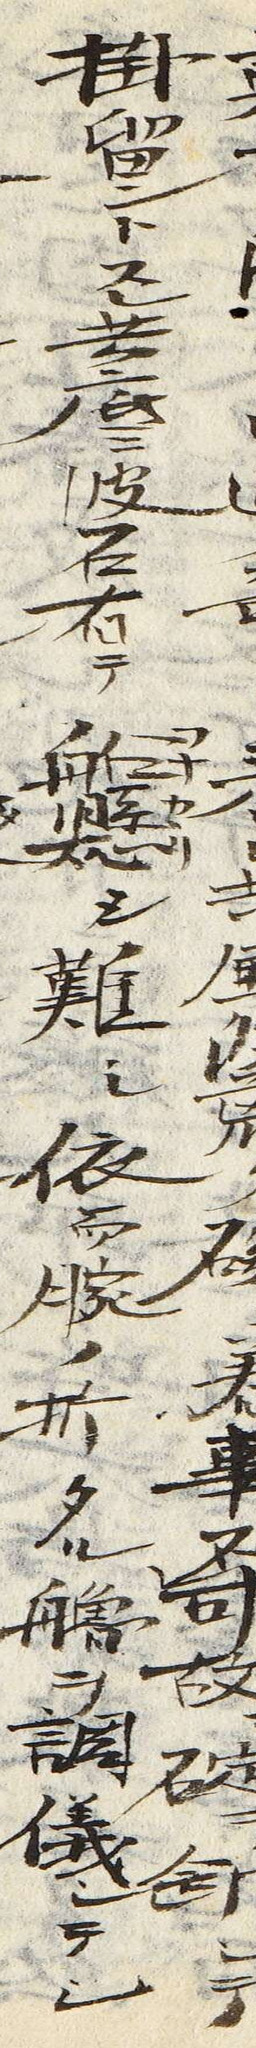掛留ントスレ共底ニ波石有テ船懸シ難シ依而腕ノ折タル艪ヲ調儀シテシ
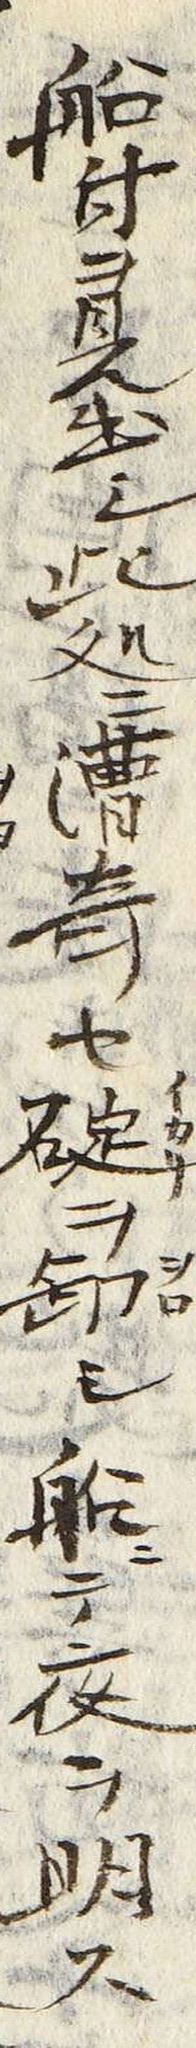船付ヲ見出シ此処ニ漕寄セ碇ヲ卸シ船テ夜ヲ明ス
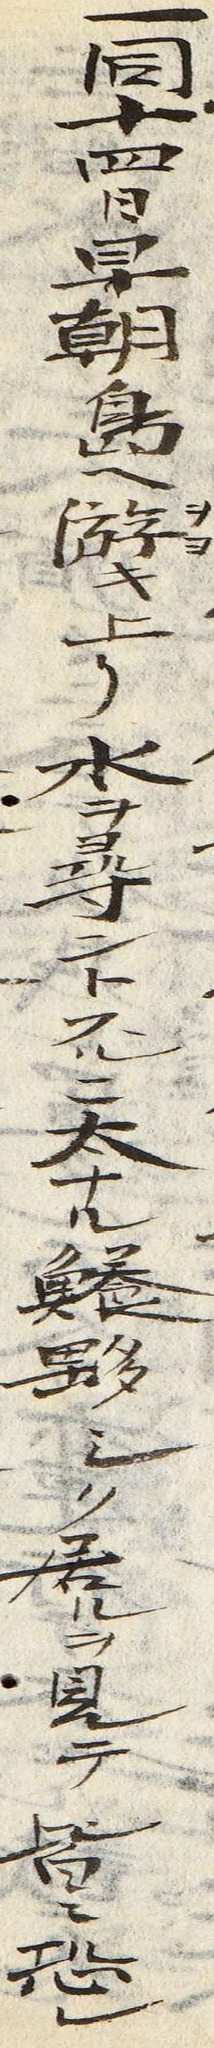一同十四日早朝島ヘ游キ上リ水ヲ尋ントスルニ太ナル鱶夥シク居ルヲ見テ皆々恐レ
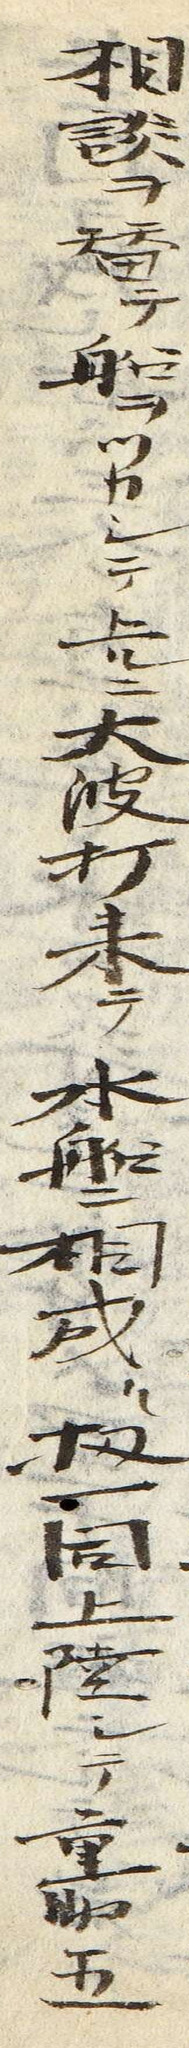相談ヲ替テ船ヲツカシテ上ルニ大波打来テ水船ニ相成ル扨一同上陸シテ重助五

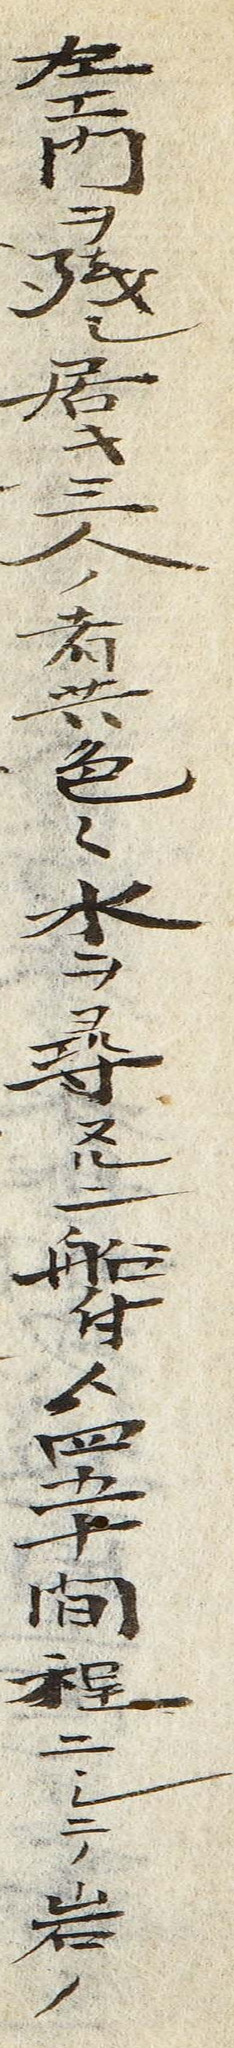左衛門ヲ残シ居キ三人ノ者共色々水ヲ尋ヌルニ船付ゟ四五十間程ニシテ岩ノ
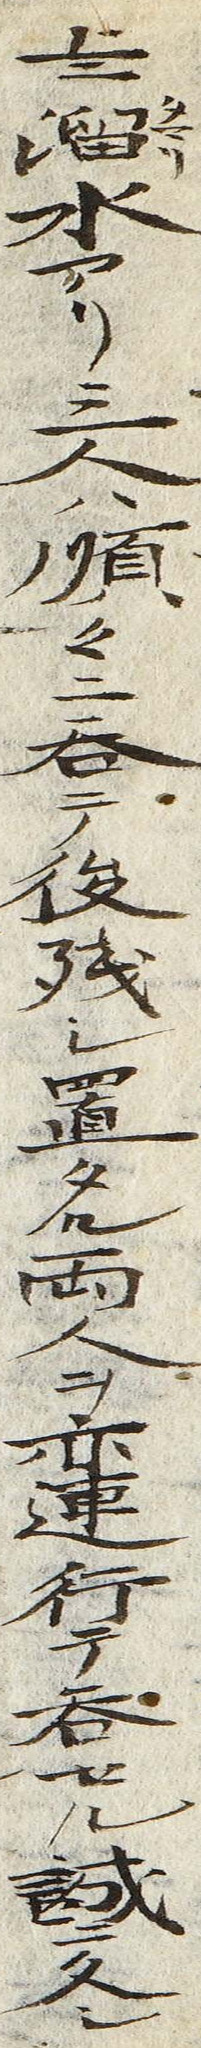上ニ溜水アリ三人ハ順々ニ呑テ後残シ置タル両人ヲ亦連行テ呑セル誠ニ久シ
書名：漂流記聞
